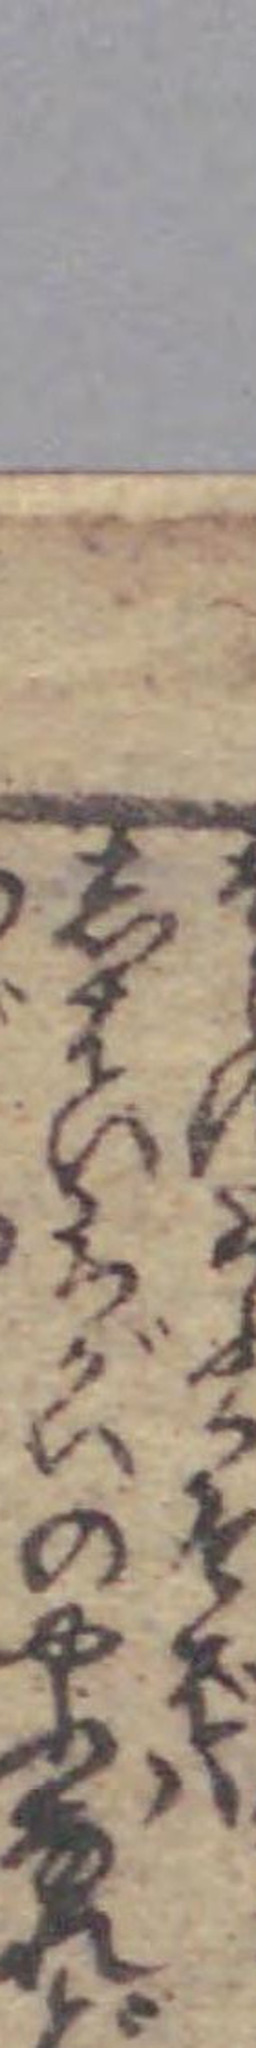しはいちがいのやふなれど
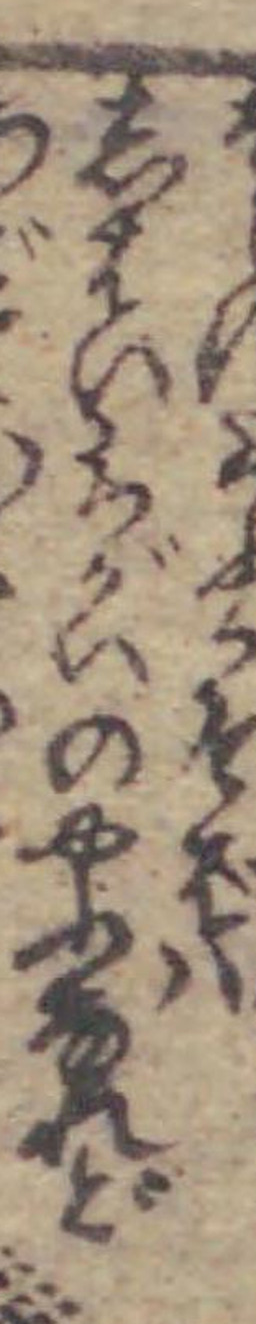しはいちがいのやふなれど
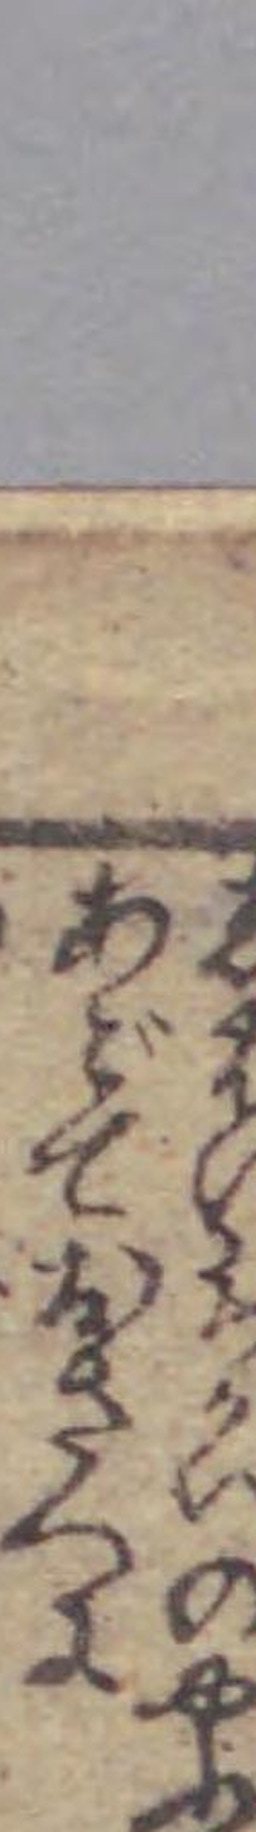あごておさへに
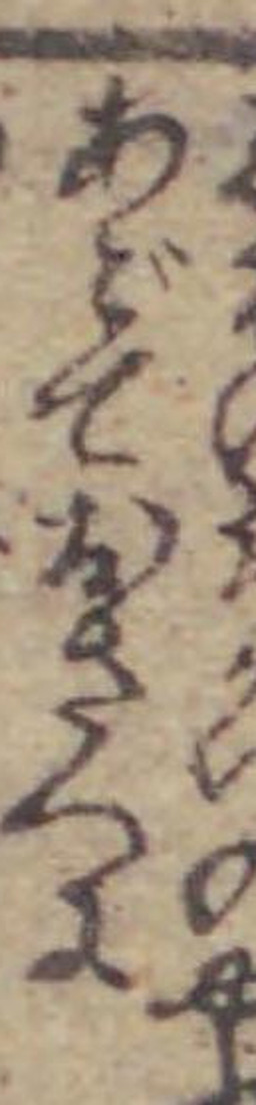あごておさへに
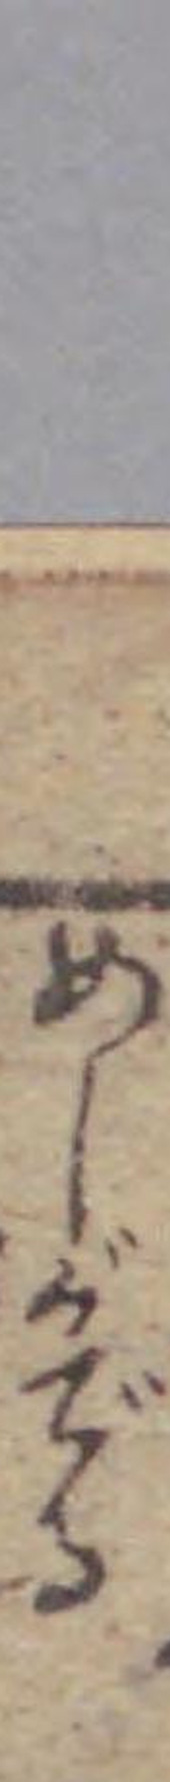めしがでる
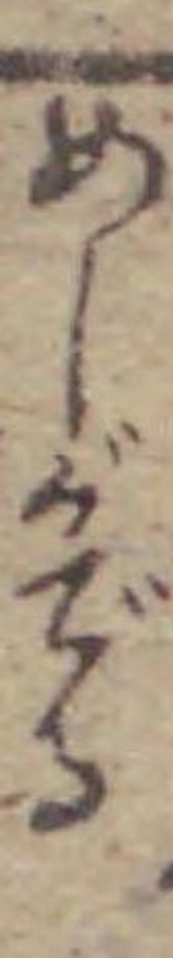めしがでる
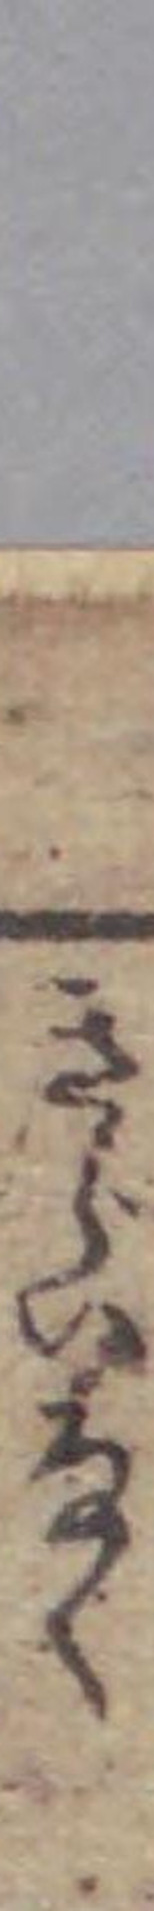きらいなく
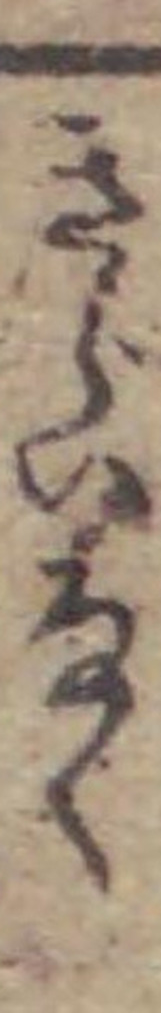きらいなく
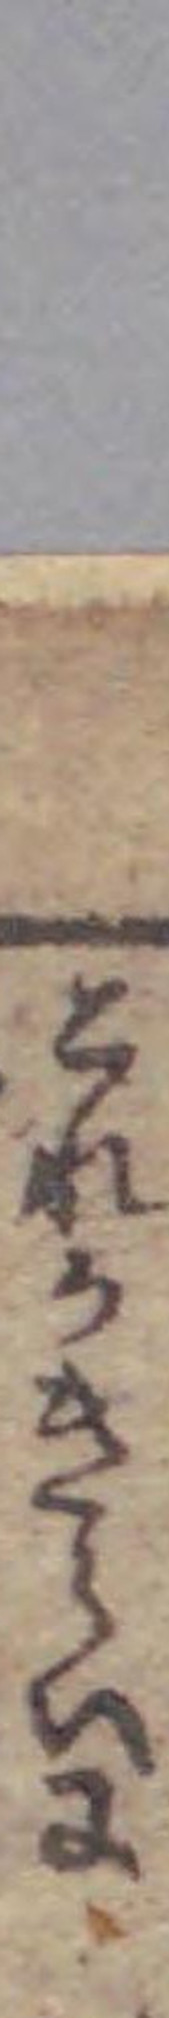これかきらいに
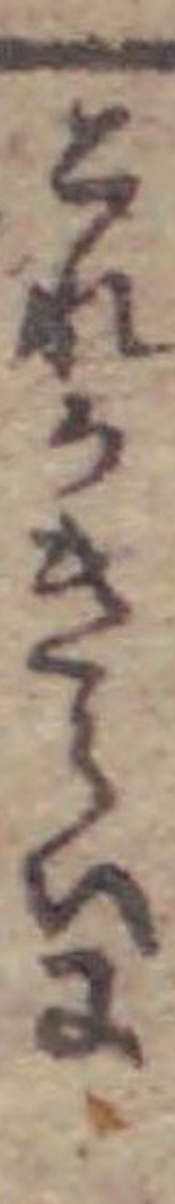これかきらいに
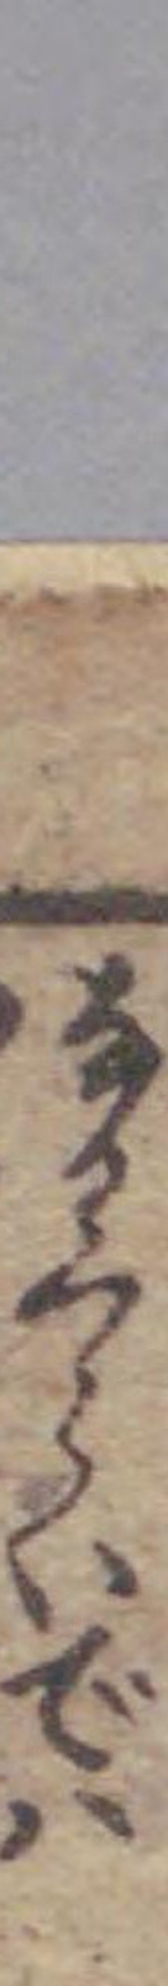なるくらいでは
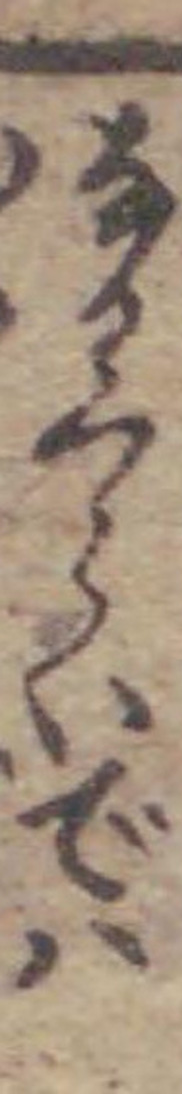なるくらいでは
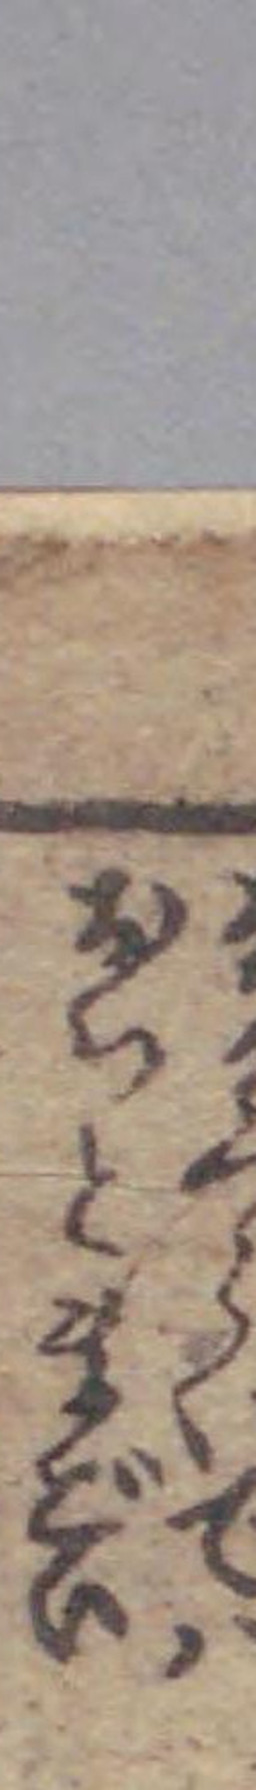おいとまごい
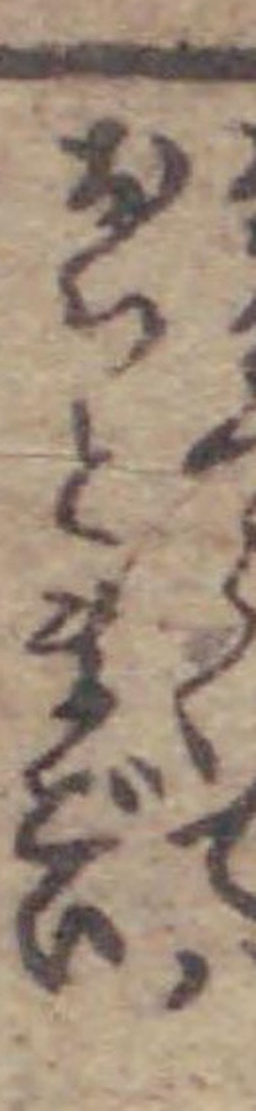おいとまごい

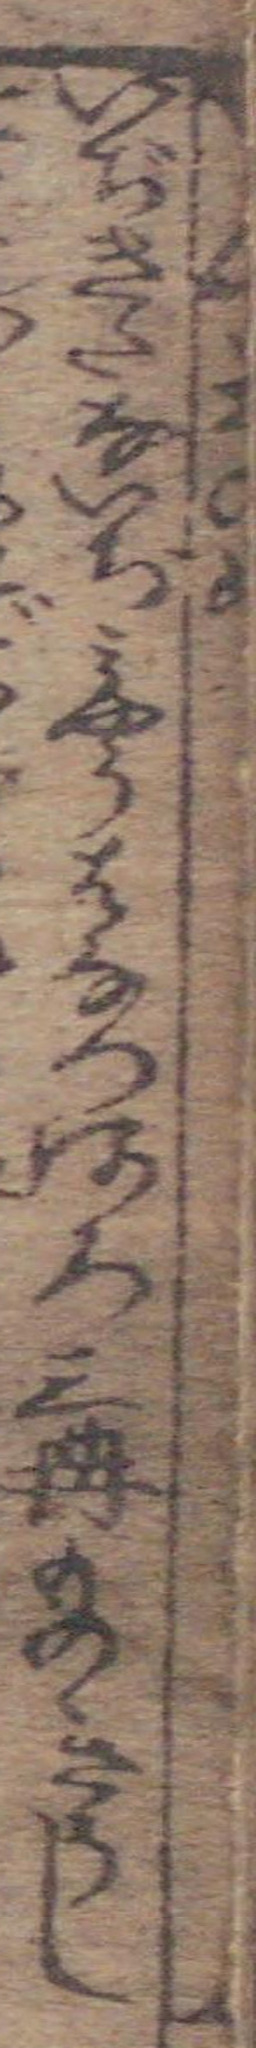いぢきたないぢみやうはなつ三冊ものゝさうし
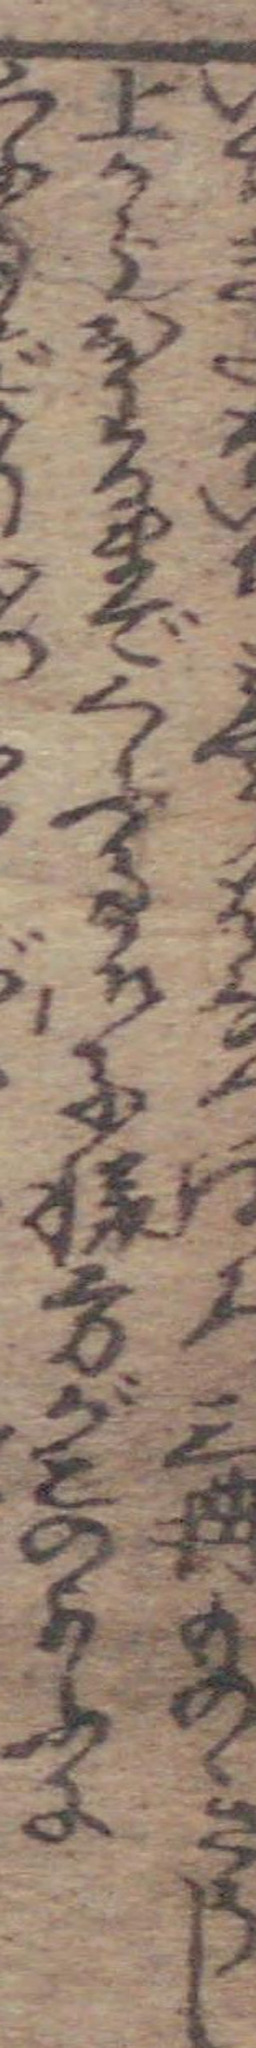上からおわるまでくふ事御子様方がこのよふに
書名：諸事米の飯 : 3巻
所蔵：国立国会図書館 National Diet Library, JAPAN
